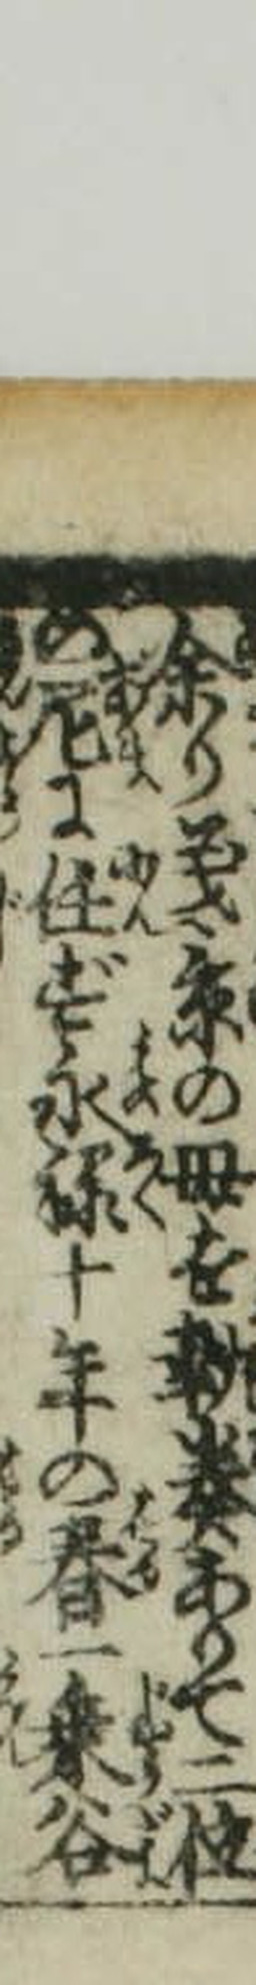の尼に任ず永禄十年の春一乗谷
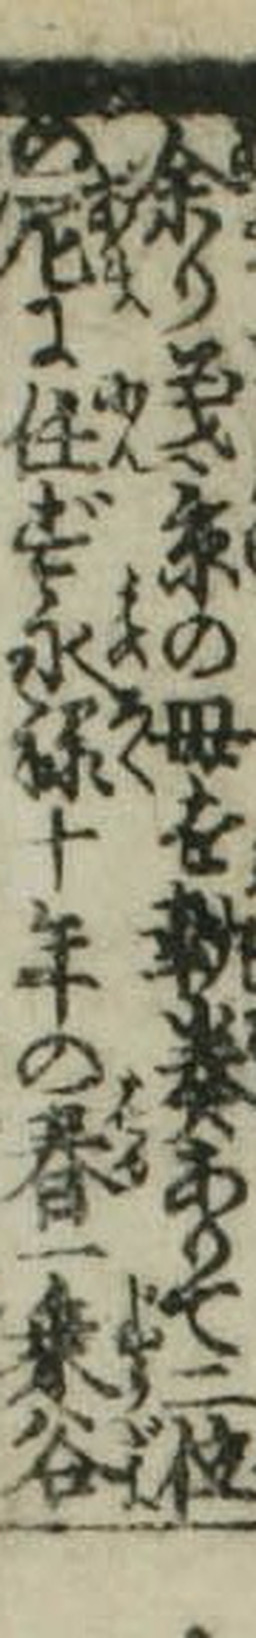の尼に任ず永禄十年の春一乗谷
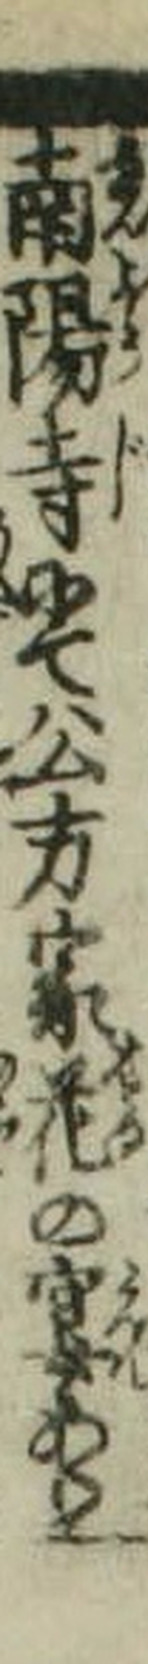南陽寺にて公方家花の宴あり
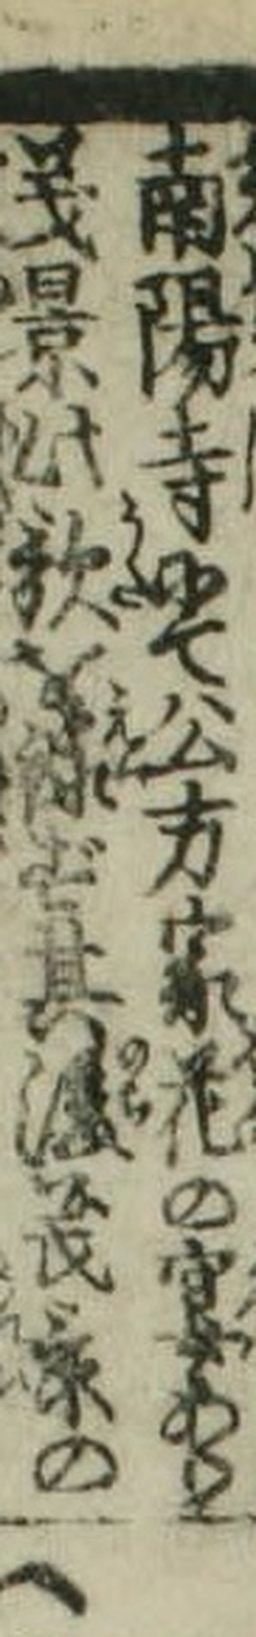義景此歌を詠ず其後義景の
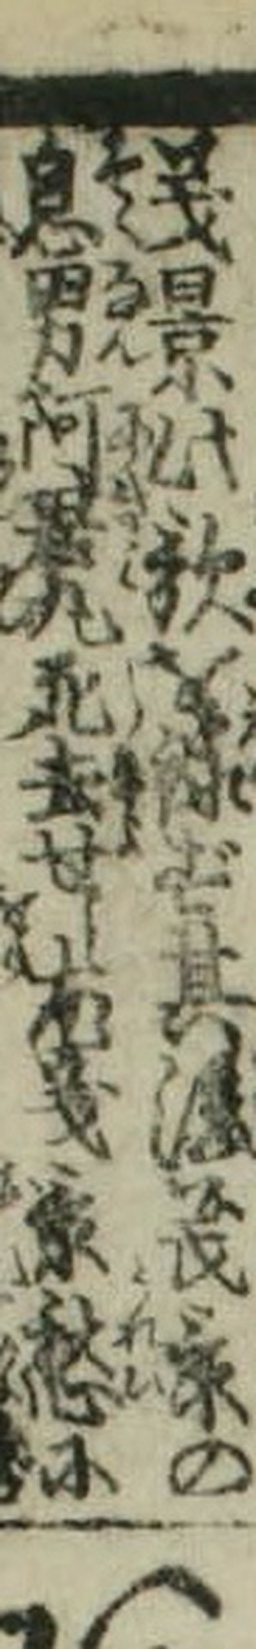息男阿君丸死去せし故義景愁に
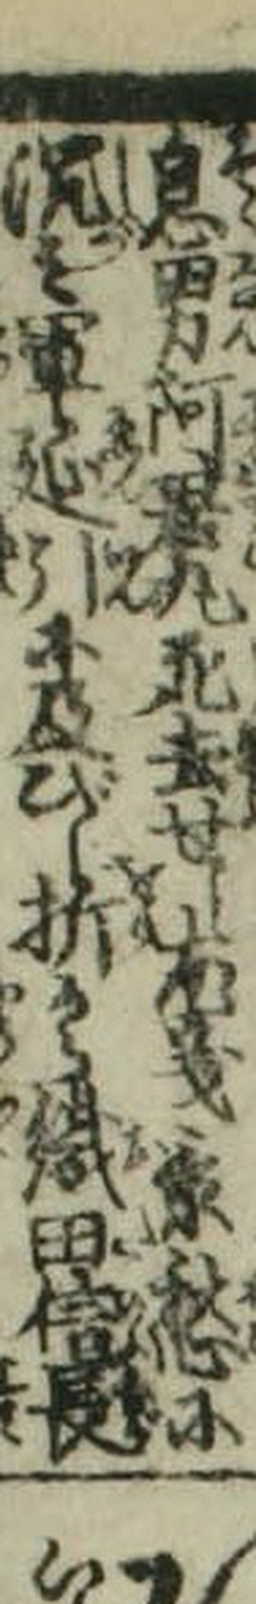沈み軍延引に及びし折から織田信長
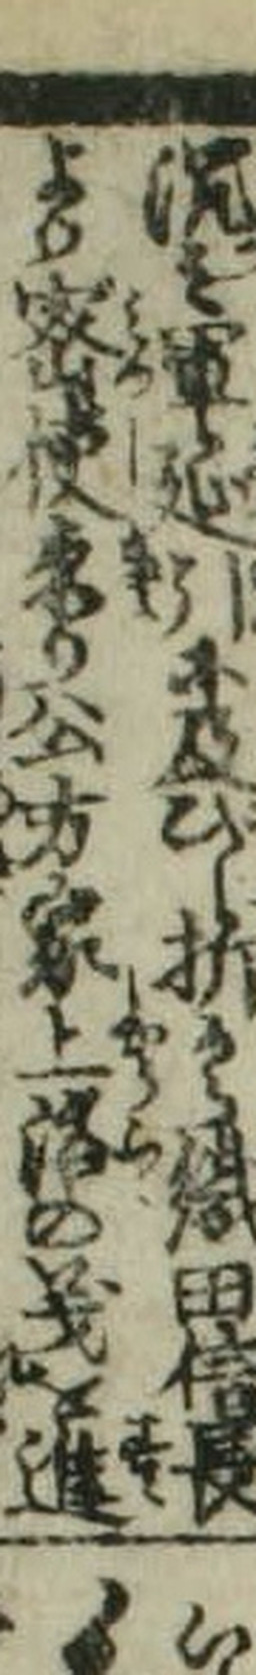より密使来り公方家上洛の義を進
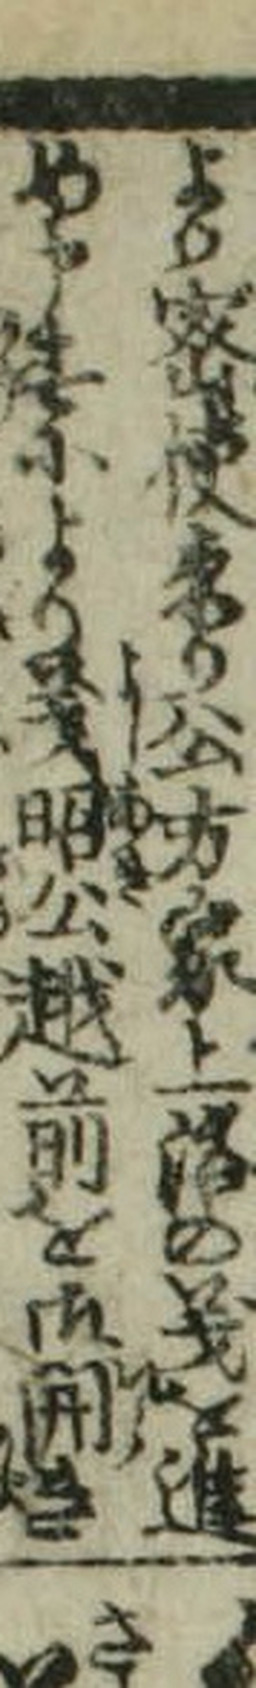め申すにより義昭公越前を御開き
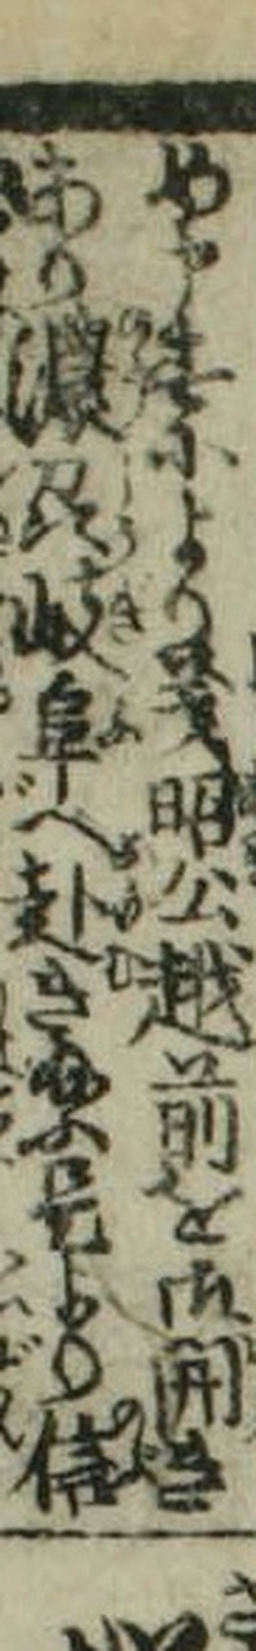あり濃州岐阜へ赴き給ふ是より信
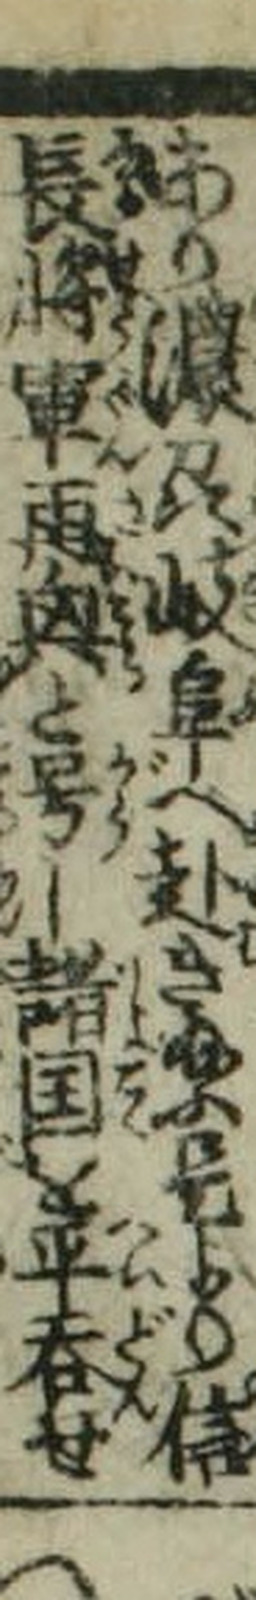長将軍再興と号し諸国を平呑せ
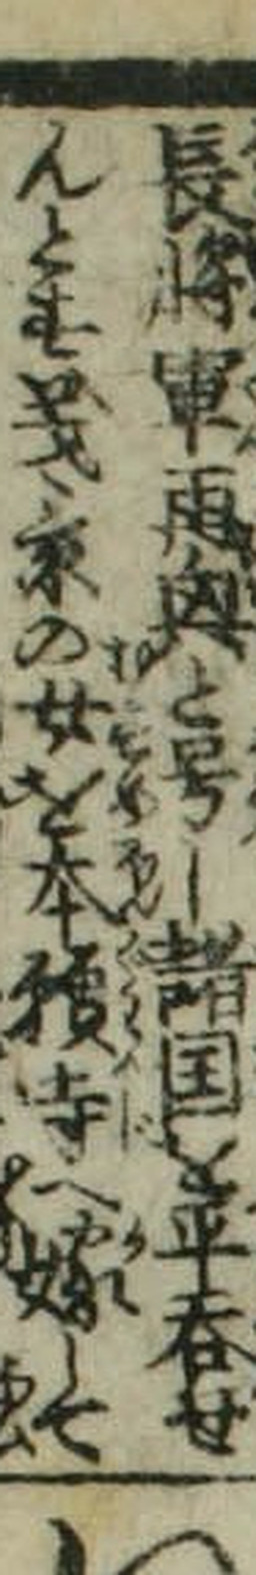んとす義景の女を本願寺へ嫁して
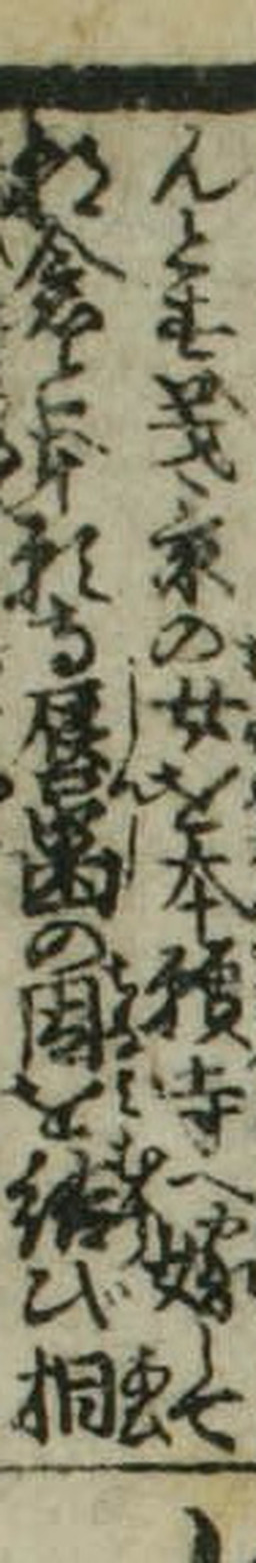朝倉と本願寺唇歯の因を結び相
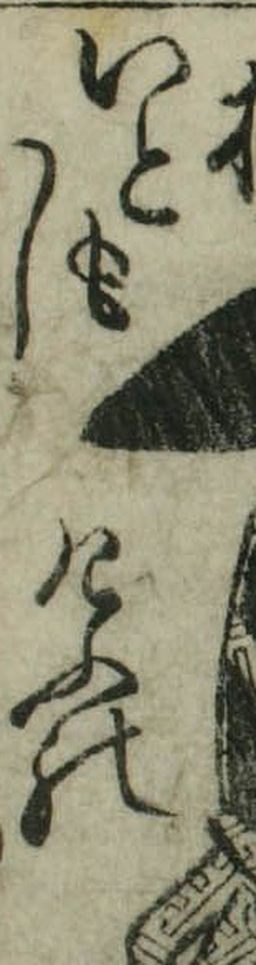いともけふの
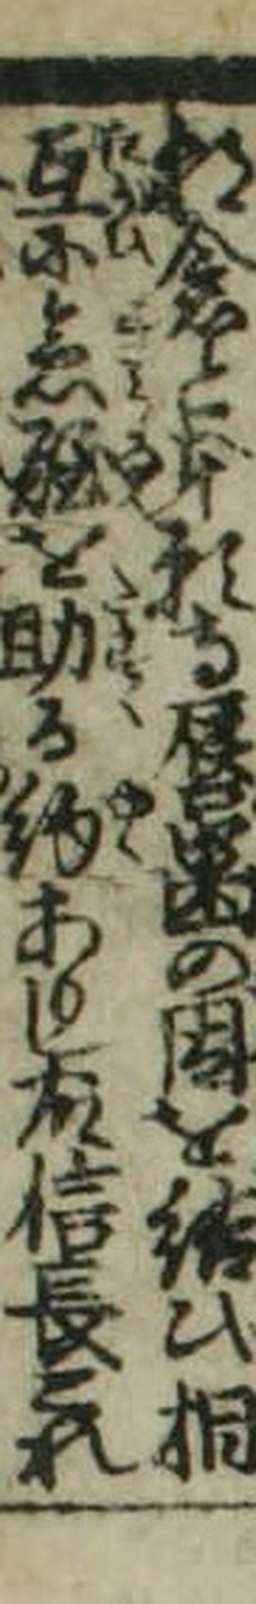互に急難を助る約ありし故信長これ
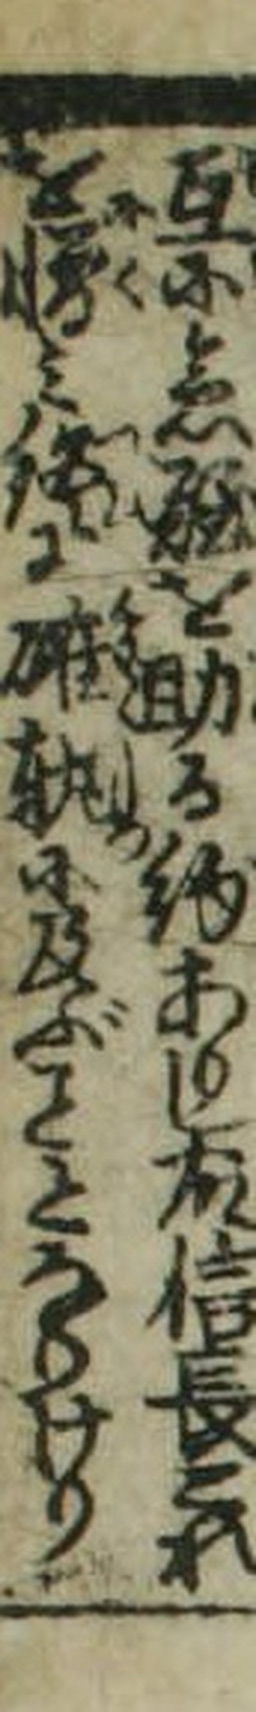を憎み終に確執に及ぶこととなりけり

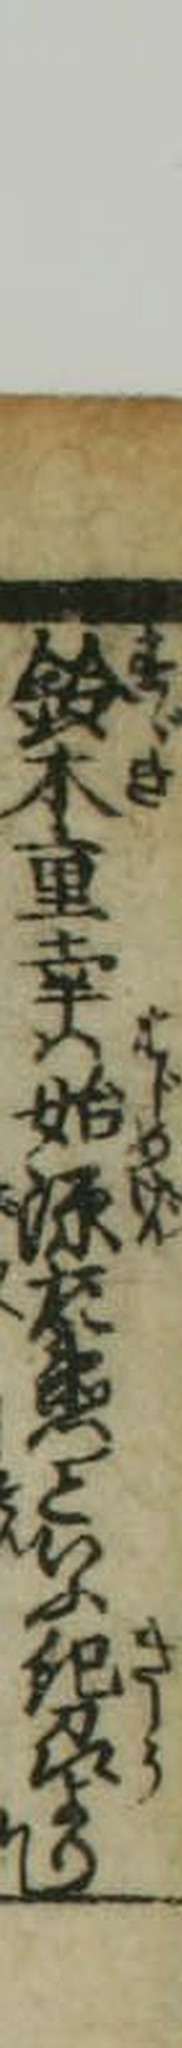鈴木重幸は始源左衛門といふ紀州より
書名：續英雄百人一首
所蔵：東京学芸大学附属図書館
